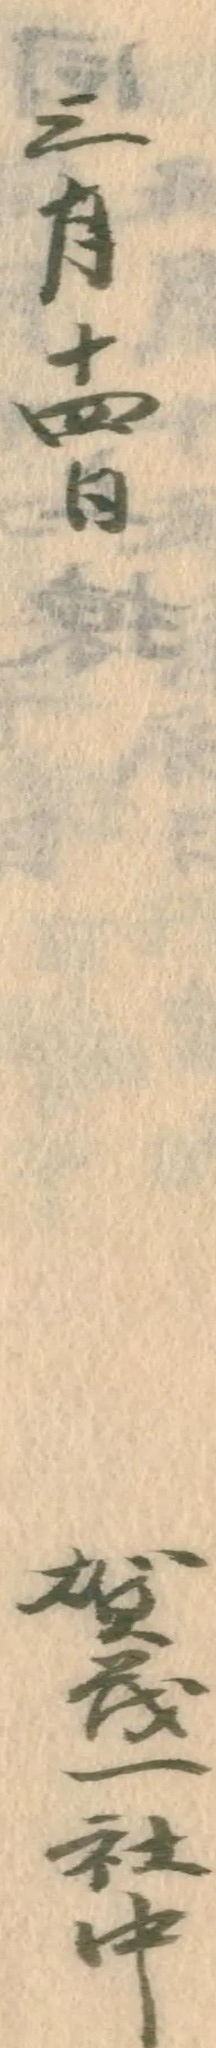三月十四日上賀茂一社中
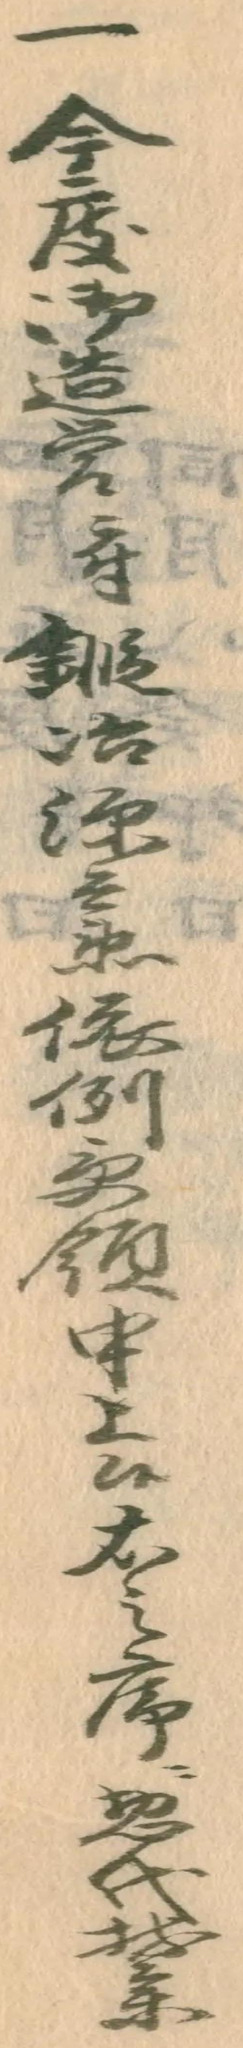一今度御造営ニ付鍛冶源兵衛依例受領申上候右之序ニ惣代持参
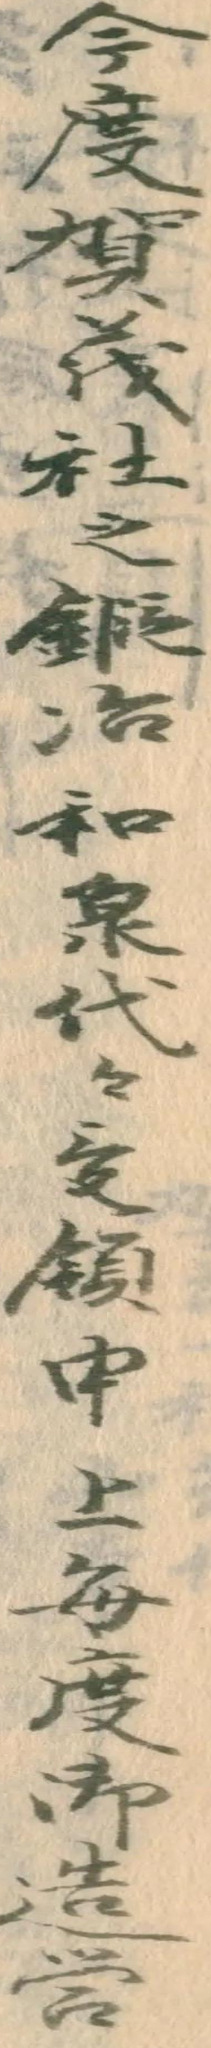今度賀茂社之鍛冶和泉代々受領申上毎度御造営
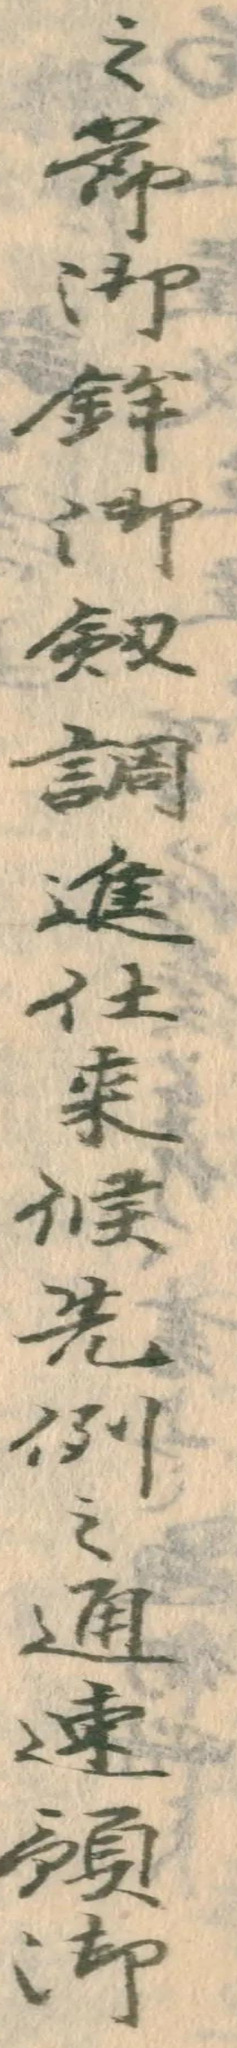之節御鉾御剱調進仕来候先例之通速預御
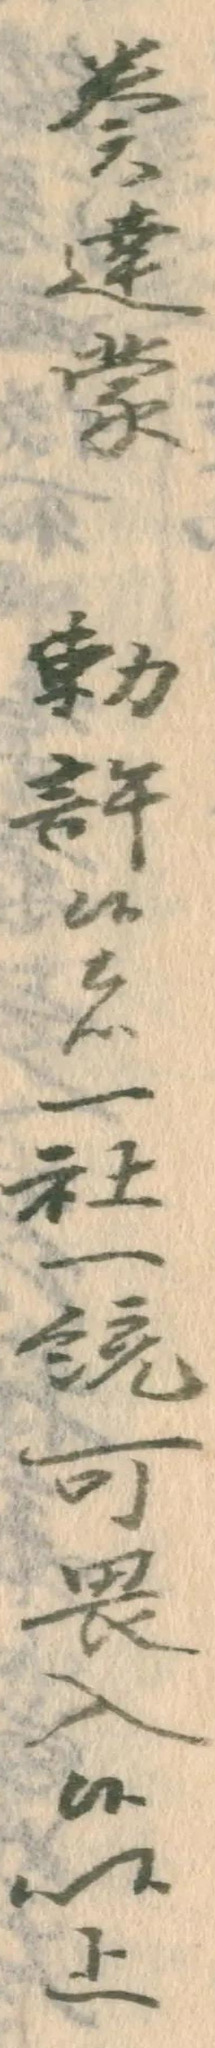奏達蒙勅許候は一社一統可畏入候以上
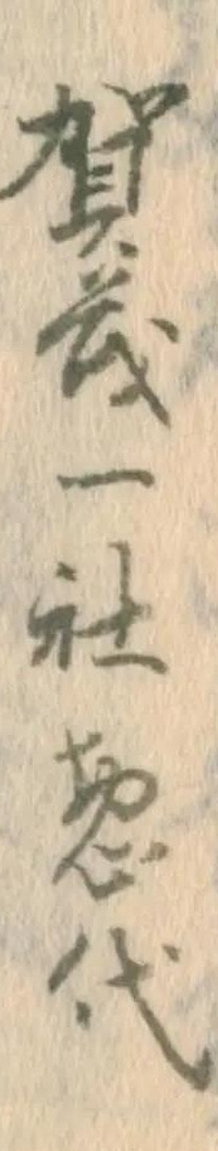賀茂一社惣代
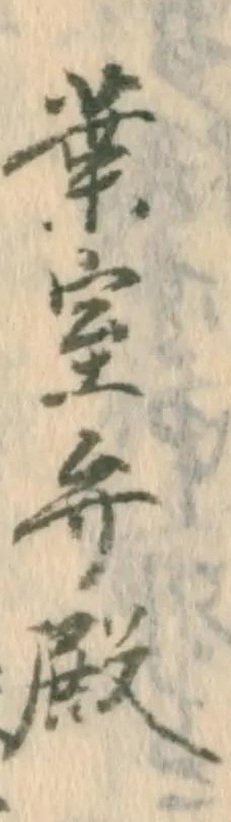葉室弁殿
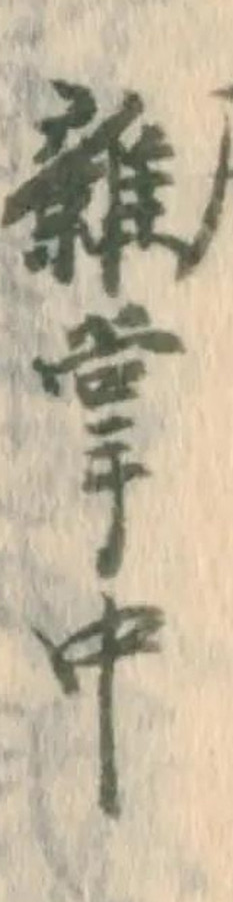雑掌中
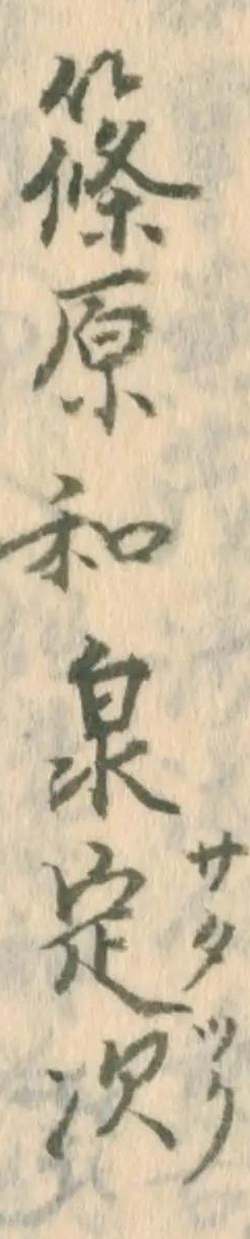篠原和泉定次

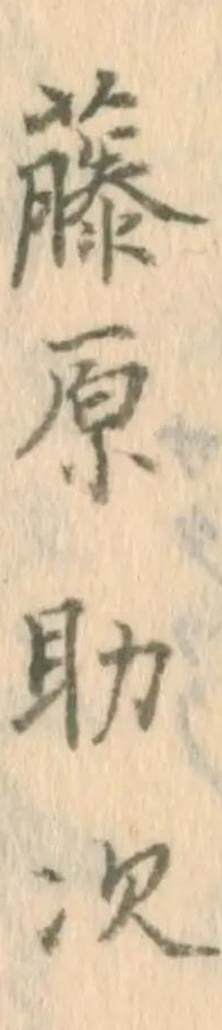藤原助次
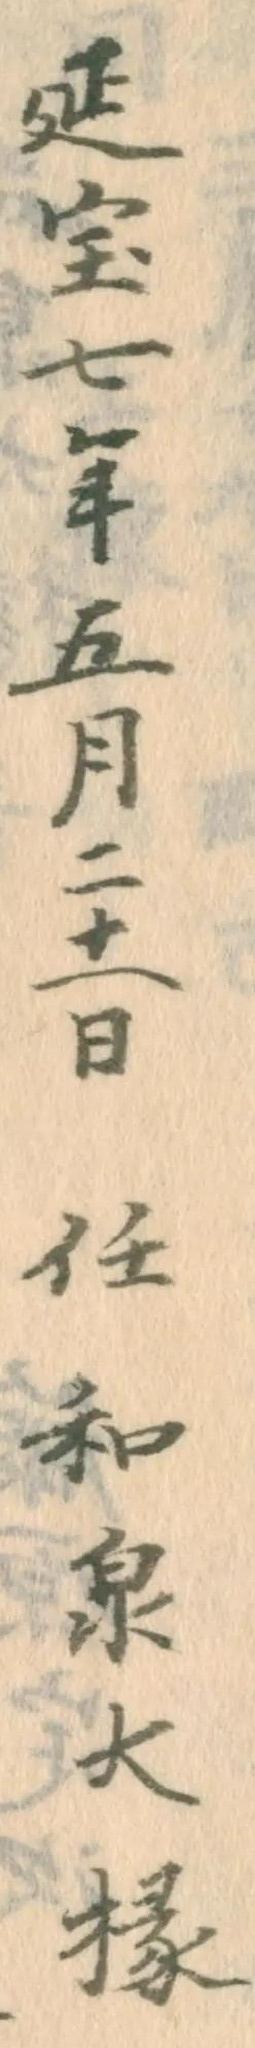延宝七年五月二十一日任和泉大掾
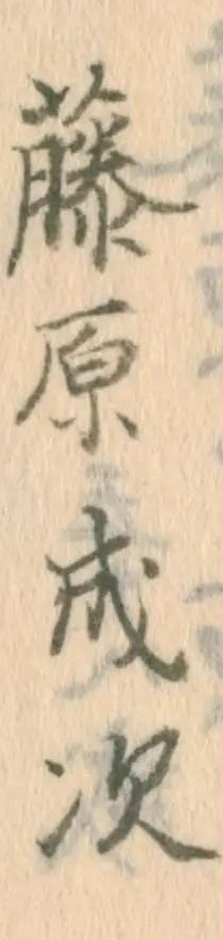藤原成次
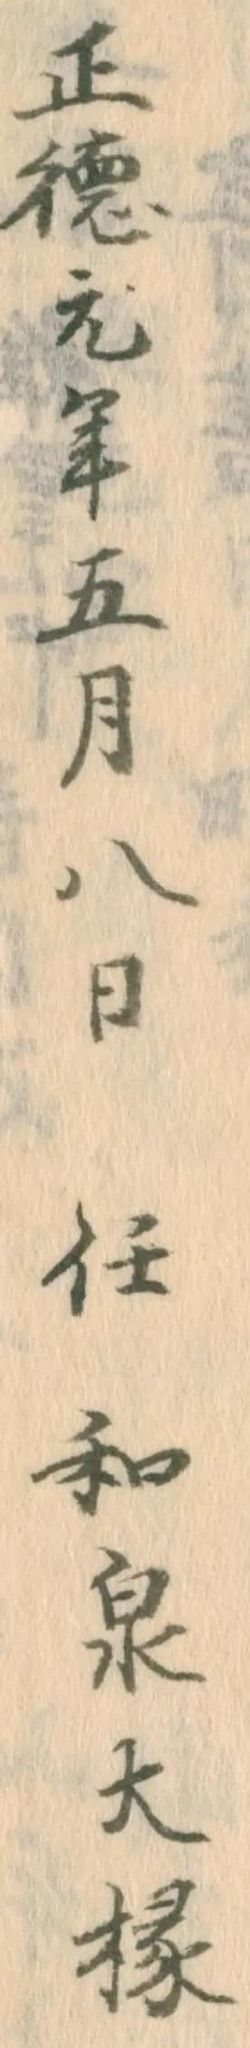正徳元年五月八日任和泉大掾
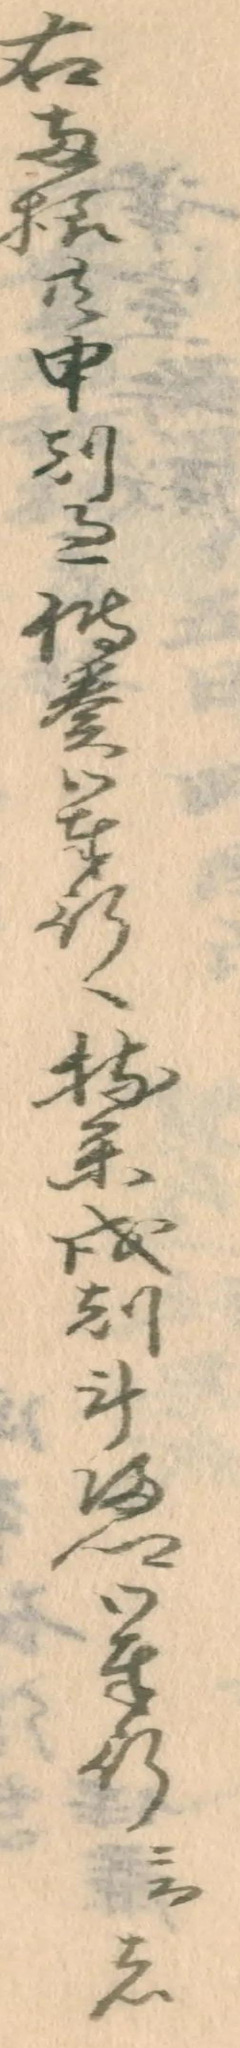右両様共申刻過伝奏御奉行へ持参戌刻計帰郷御奉行ニ而は
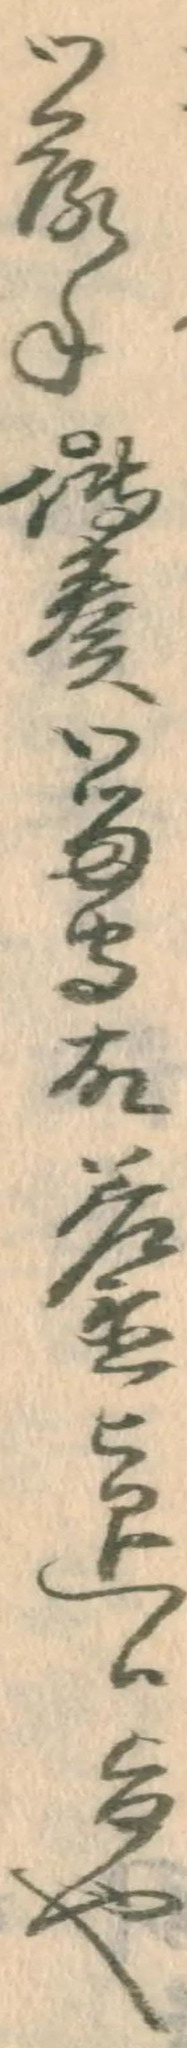御落手￮伝奏御留守故差置被退候旨也
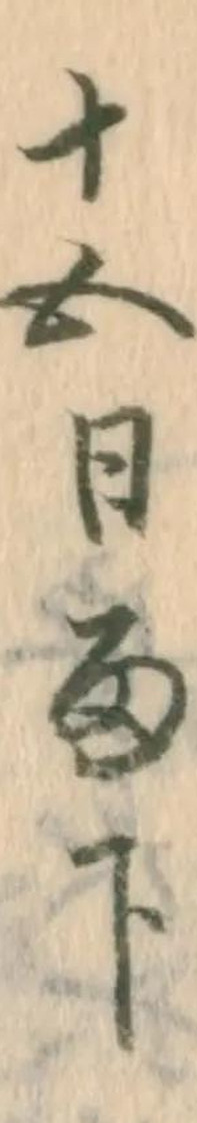十五日雨下
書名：賀茂社記録. 第17冊
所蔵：国立国会図書館 National Diet Library, JAPAN
